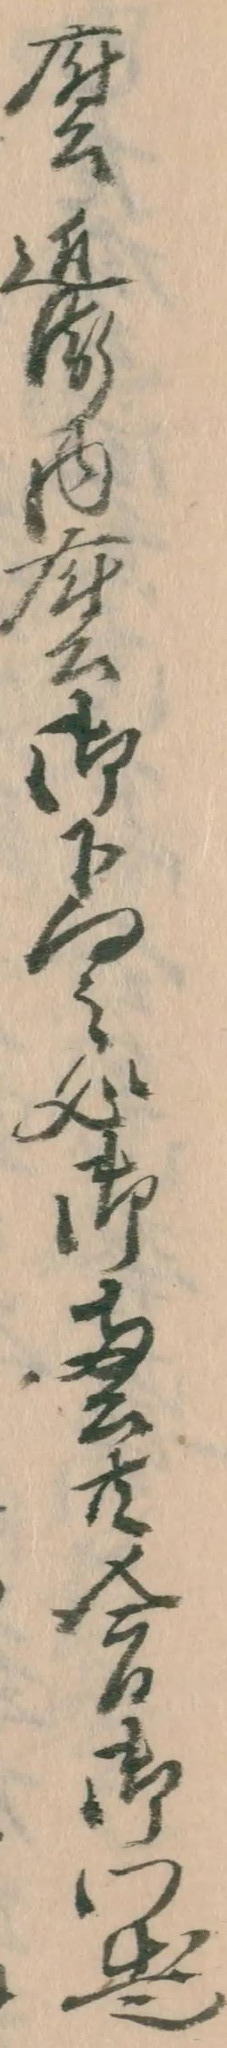府公近衛内府公御下向之処御両公共今日御門出也
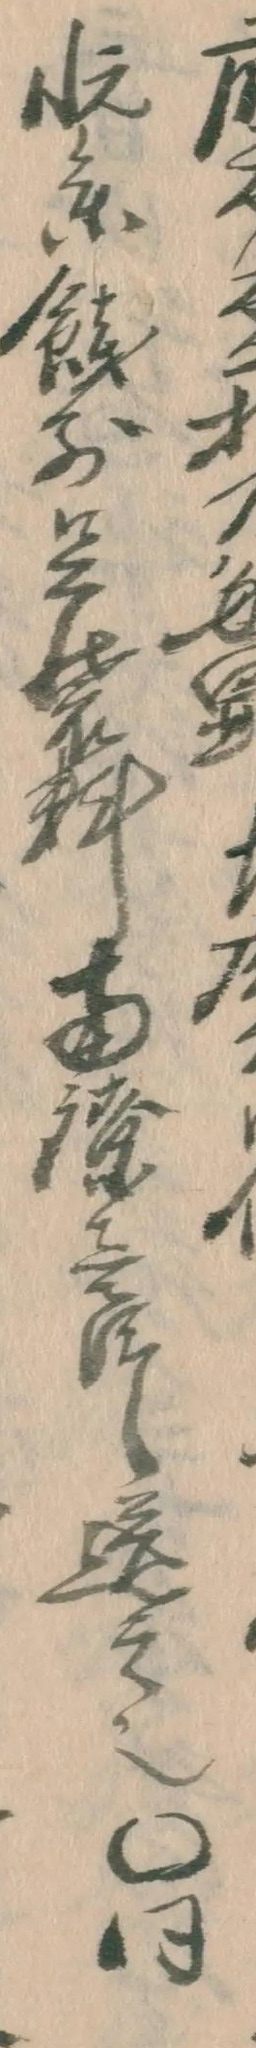祝参饑前足袋料南鐐壱片送之也〇同
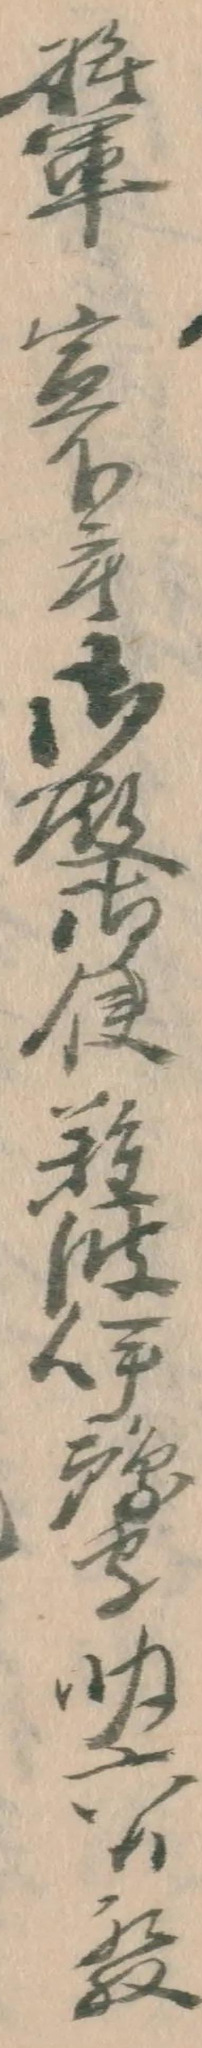将軍宣下ニ付御殿御使難波伊豫守明六日発
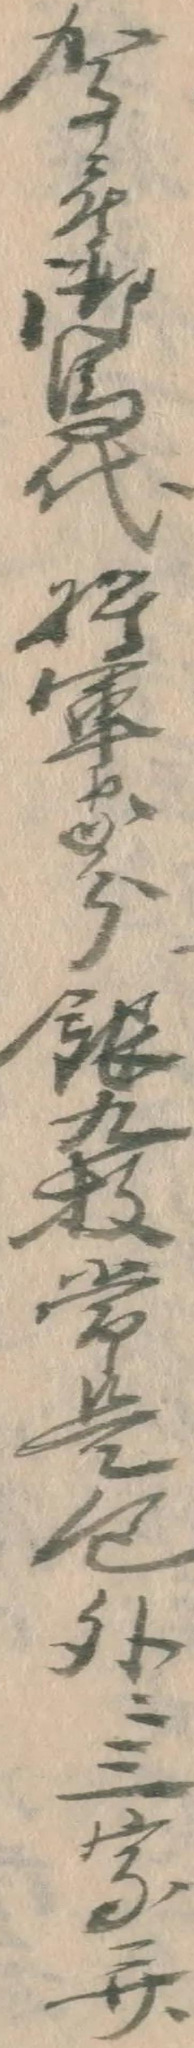駕ニ付御馬代将軍家分銀九枚常是包外に三字并
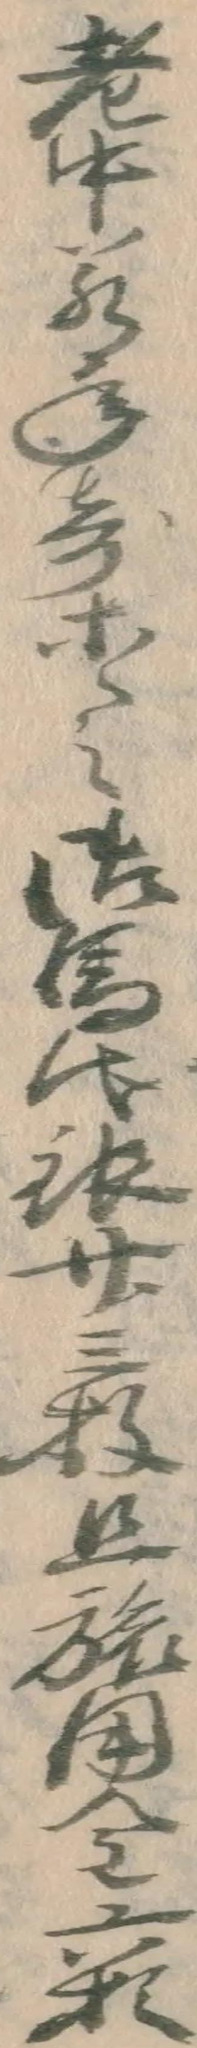老中若年寄等々之御馬代銀廿三枚且旅用金六拾
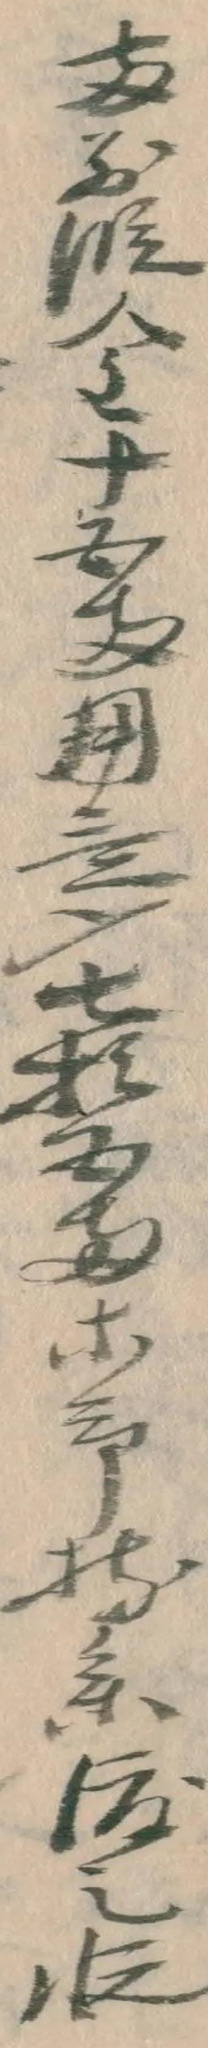両別段金十五両用意〆七拾五両等市持参渡之祝
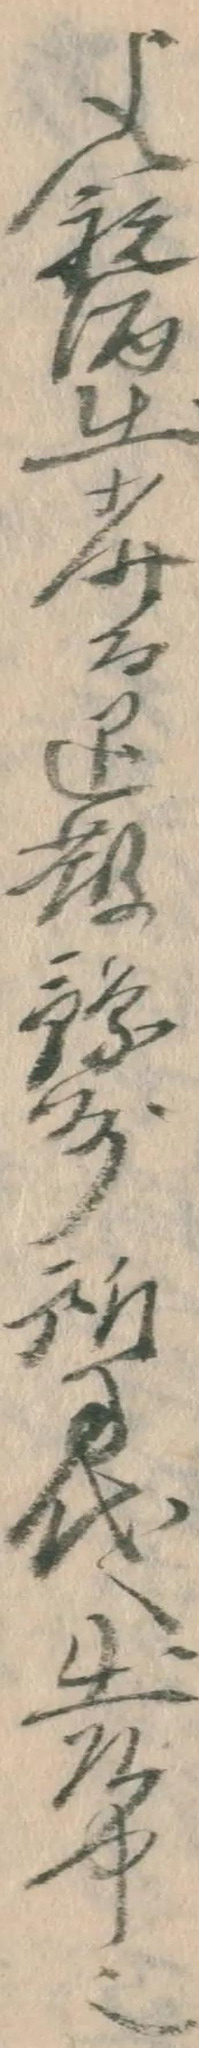申入祝酒出相済而退散豫州所司代へ出頭中也
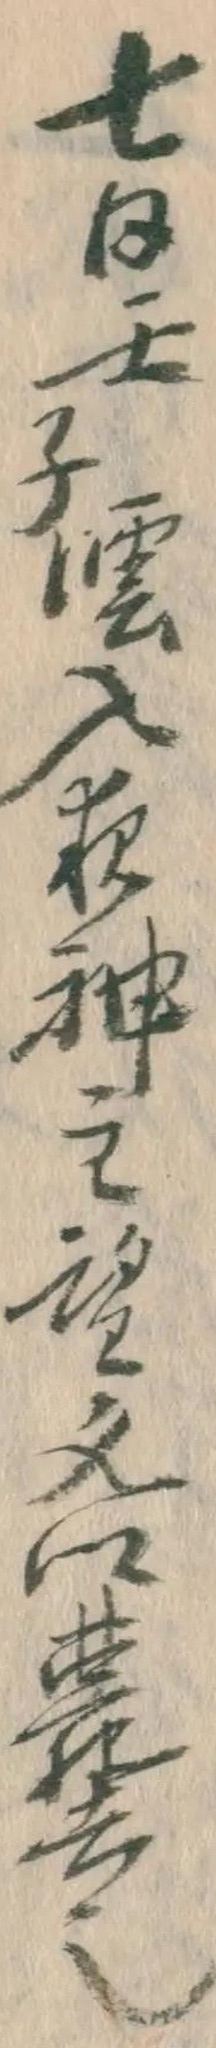七日壬子曇入夜神主望久卿薨去也
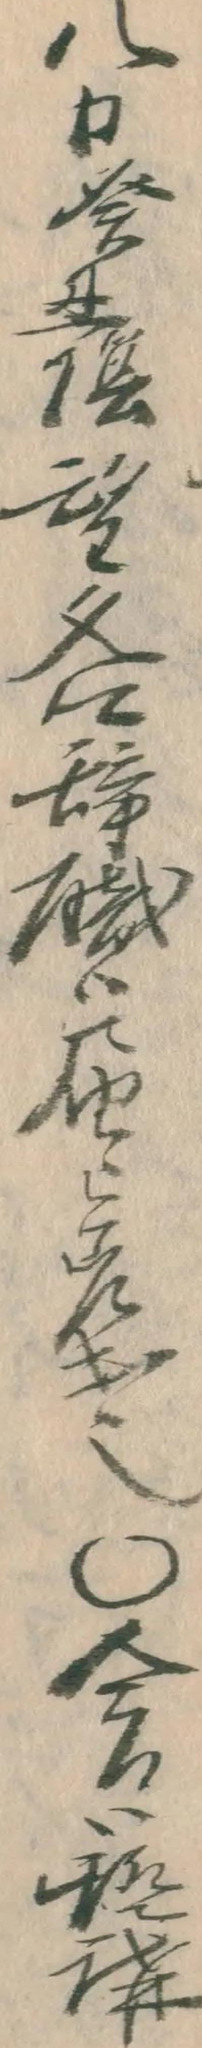八日癸丑陰望久卿辞職御届被差出也○今日御極講
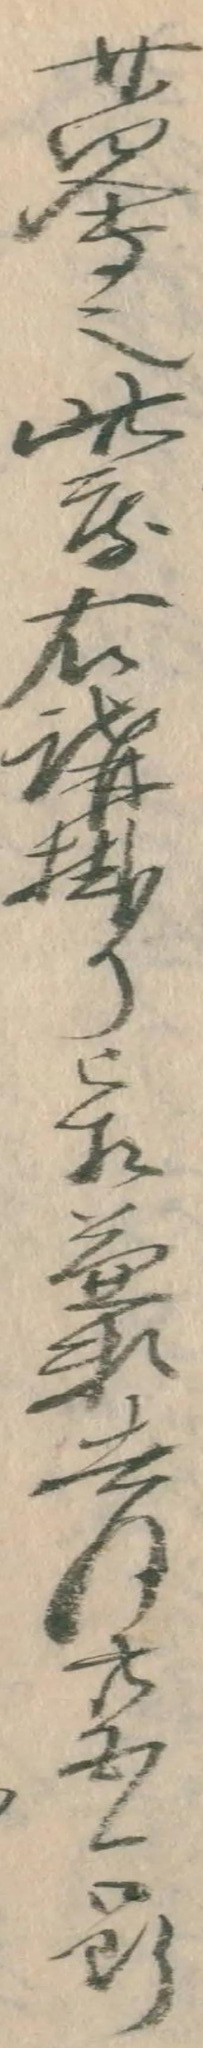廿四會也此度右講掛り被相兼頼去月廿五日御断
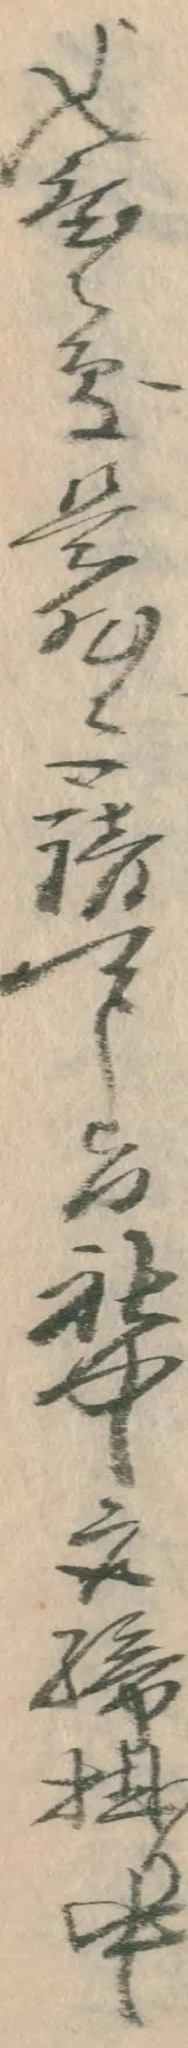申入置候處是ニ御請可申旨社中取締掛り中

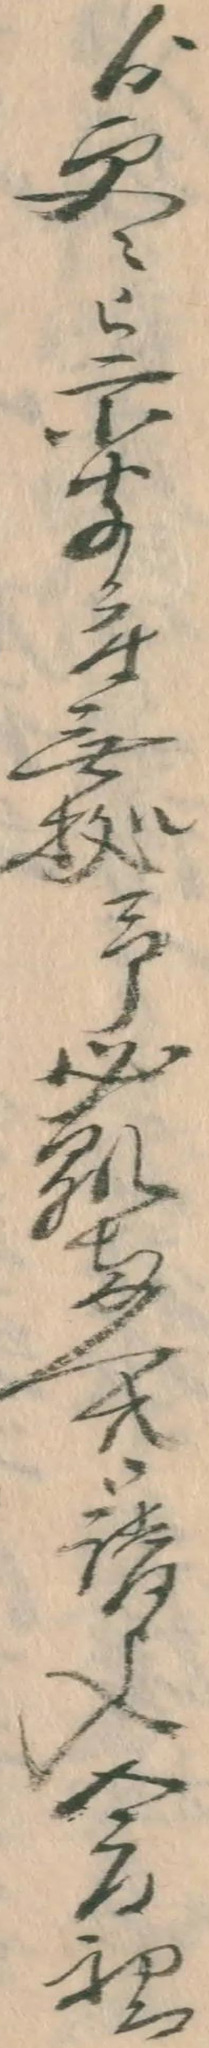ゟ更ニ被示聞ニ付無拠予必顕両人共御請申入今日初而
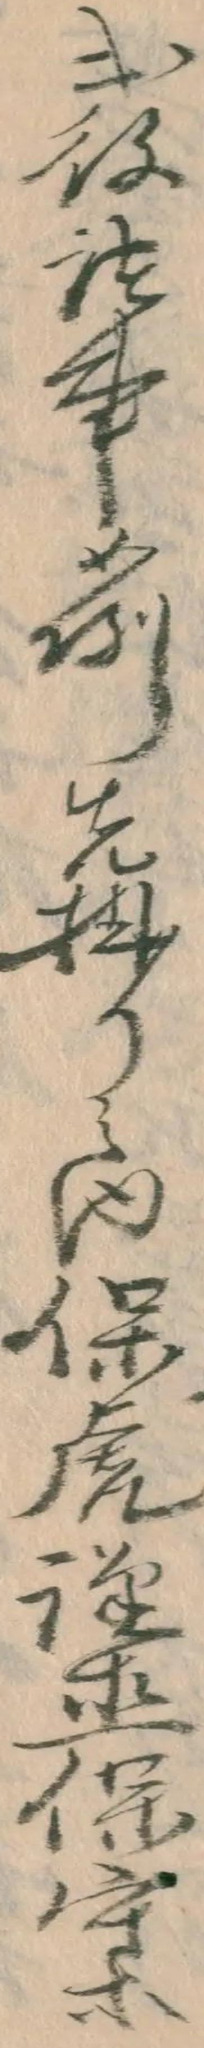出役諸事如例先掛り之内保虎謹直保守等
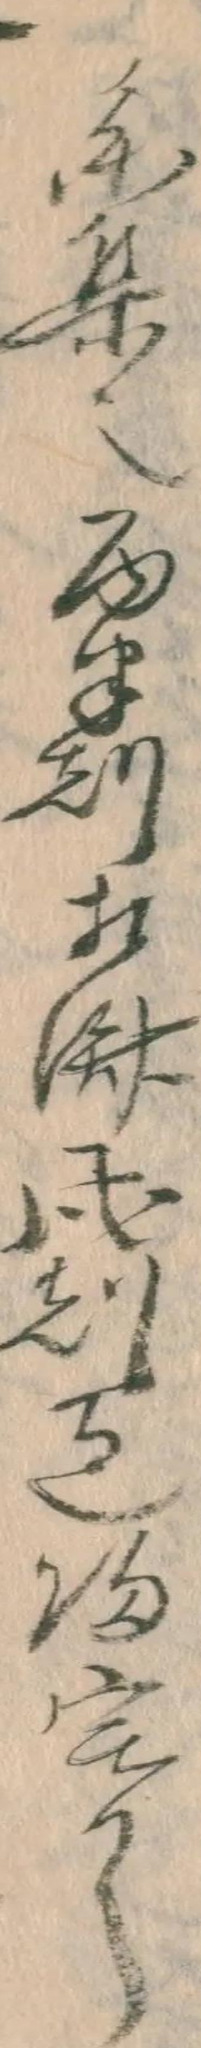参集也酉半刻相済戌刻過帰宅也
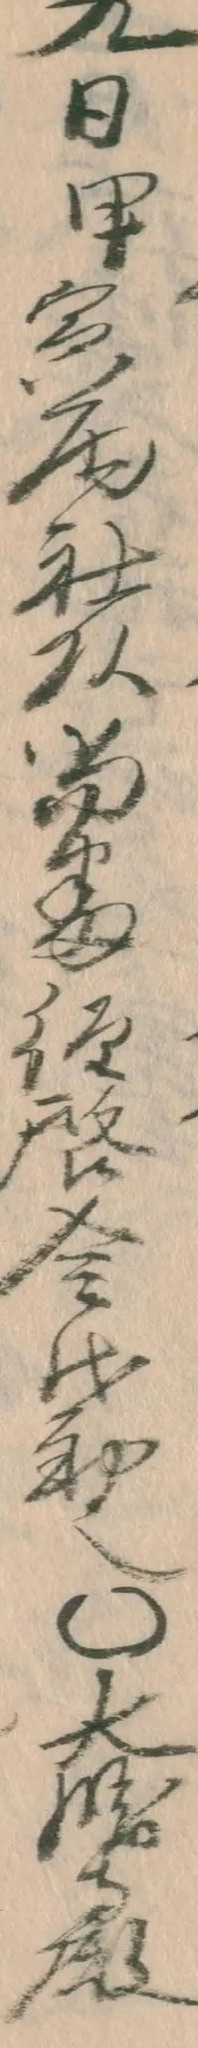九日甲寅雨社頭當番経啓令代勤之〇大勝寺殿
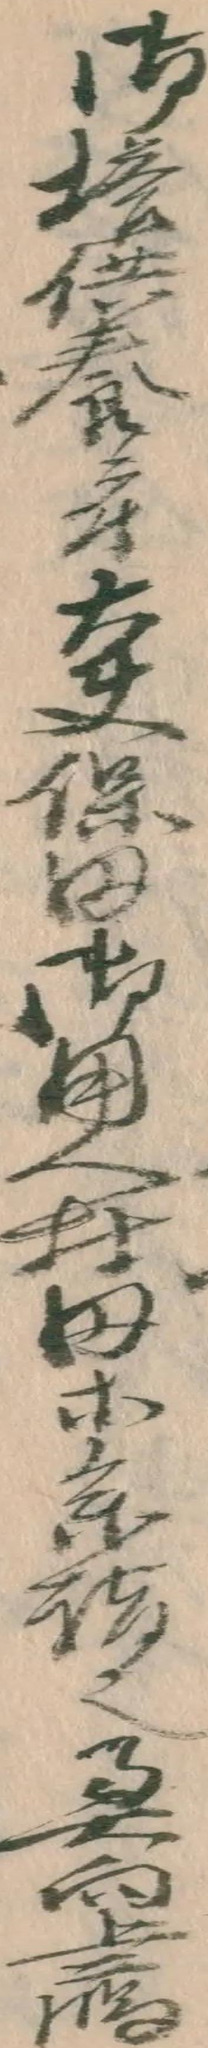御塔供養ニ付大夫保田御用人村田等参詣也奥向上臈
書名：賀茂社記録. 第67冊
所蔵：国立国会図書館 National Diet Library, JAPAN
